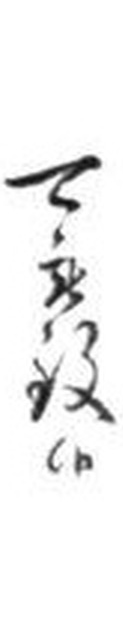可被致候
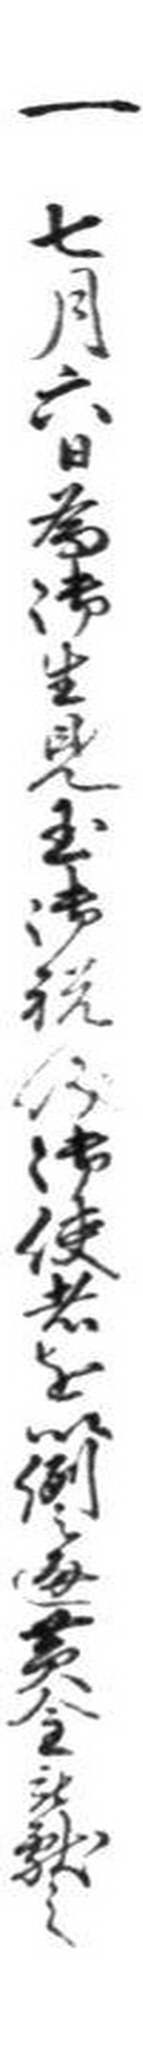一七月六日為御生見玉御祝儀御使者を以例之通黄金被献之
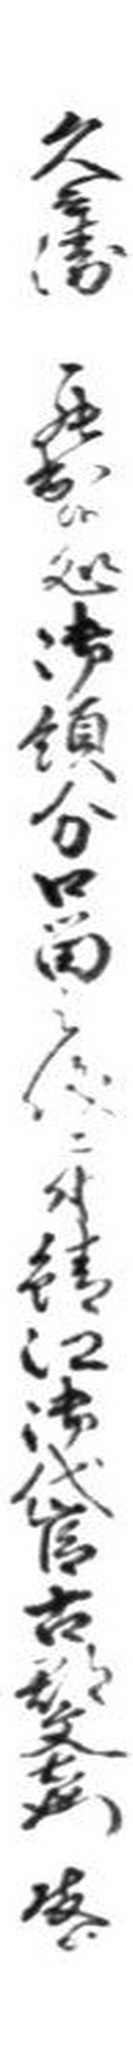久兵衛罷出候処御領分口留之儀ニ付鯖江御代官古郡文右衛門殿ゟ
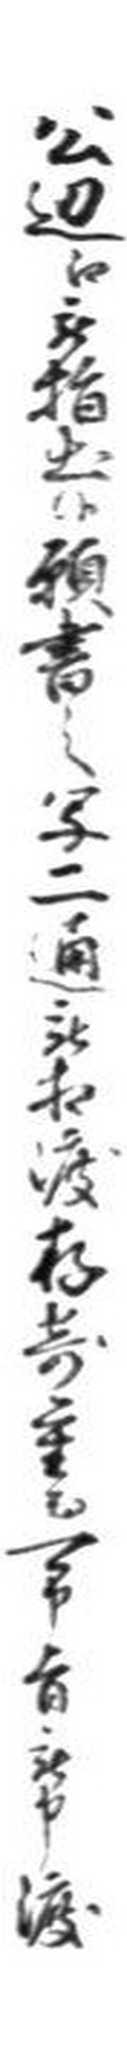公辺江被指出候願書之写二通被相渡存寄重而可申旨被申渡
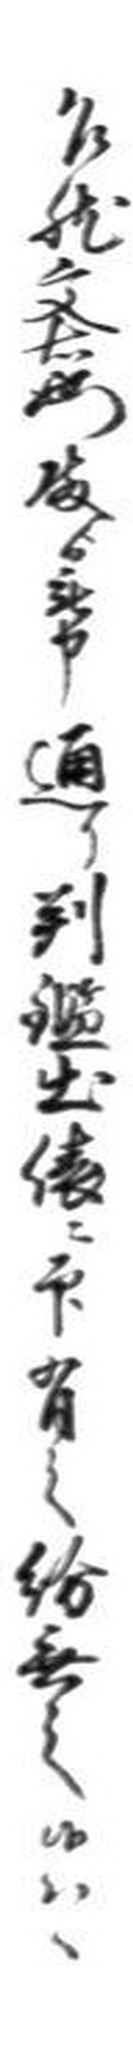乍然文右衛門殿ゟ被申通り判鑑出俵ニ印有之紛無之候ハヽ
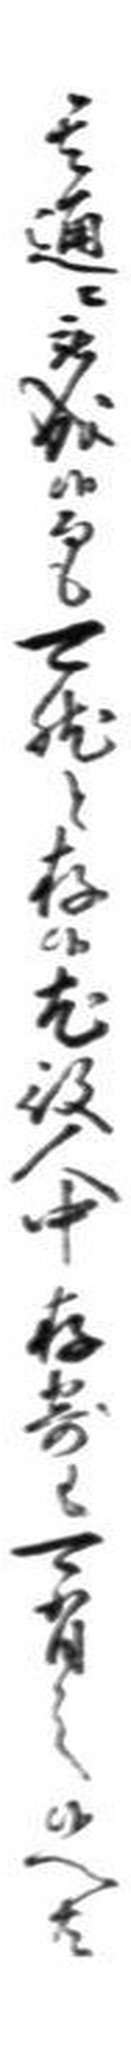其通ニ被成候而も可然と存候尤役人中存寄も可有之候へ共
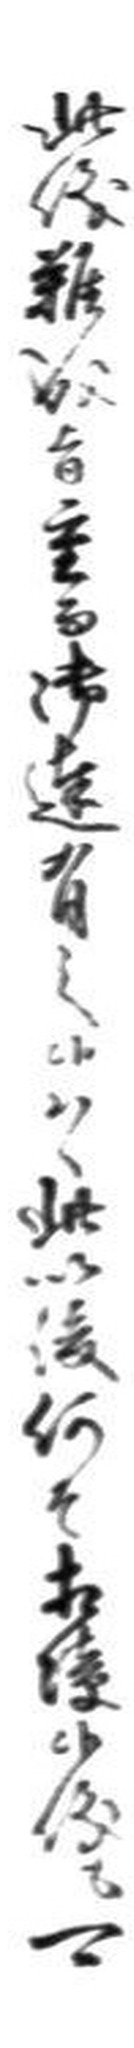此儀難成旨重而御達有之候ハヽ此以後何そ相障候儀も可
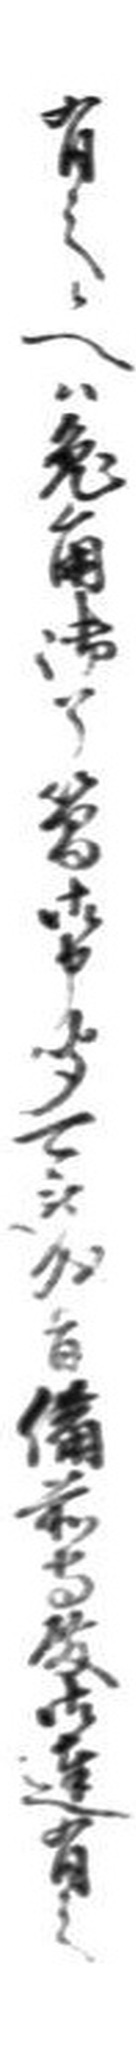有之候ヘハ兎角御了簡御申聞被成旨備前守殿御達有之
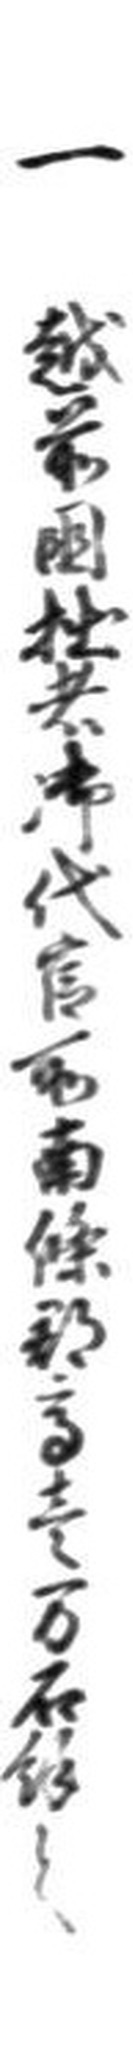一越前国拙者御代官所南条郡高壱万石余之
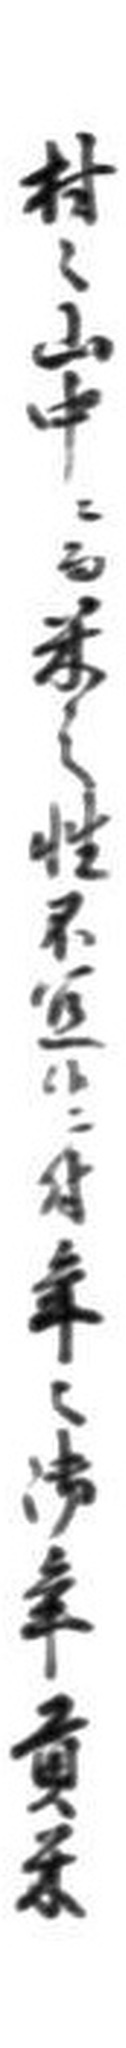村々山中ニ而米之性不宜候ニ付年々御年貢米
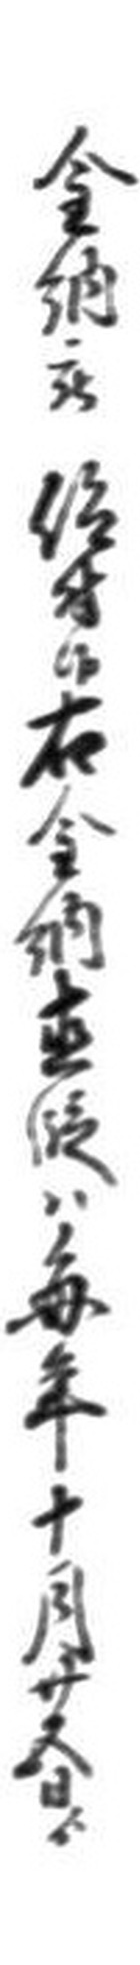金納被仰付候右金納直段ハ毎年十月廿五日ゟ
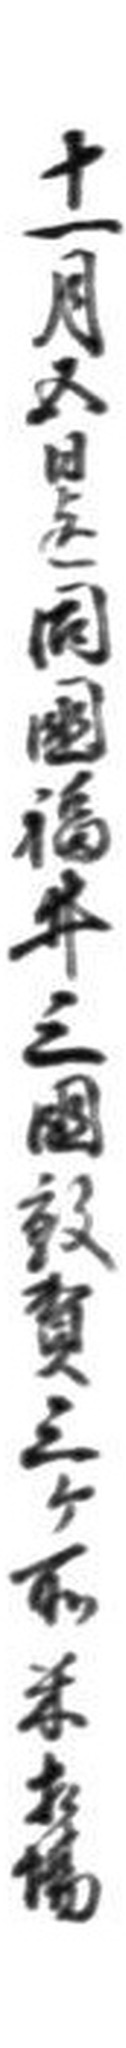十一月五日迄同国福井三国敦賀三ケ所米相場

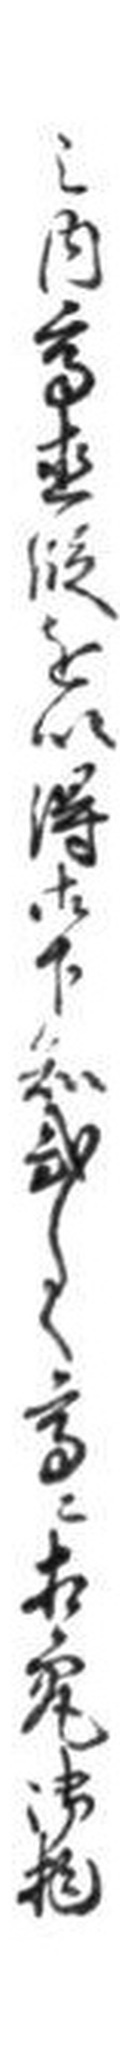之内高直段を以得御下知弐匁高ニ相究御物
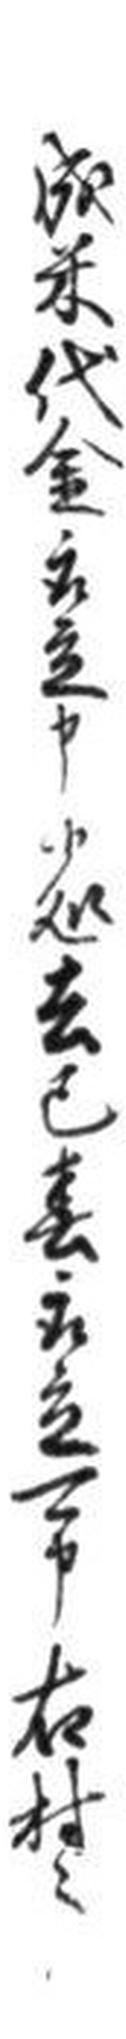成米代金取立申候処去巳春取立可申右村々
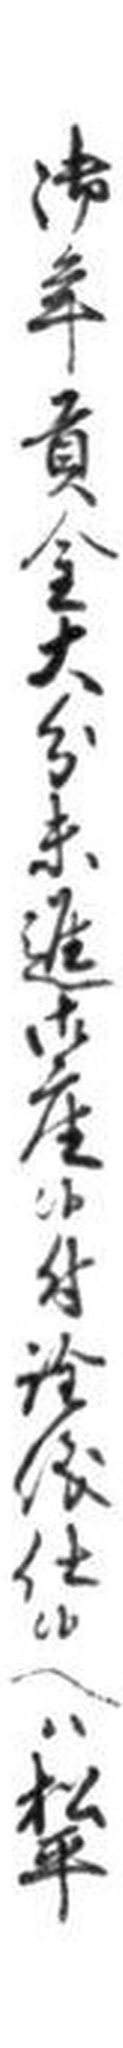御年貢金大分未進御座候付詮議仕候ヘハ松平
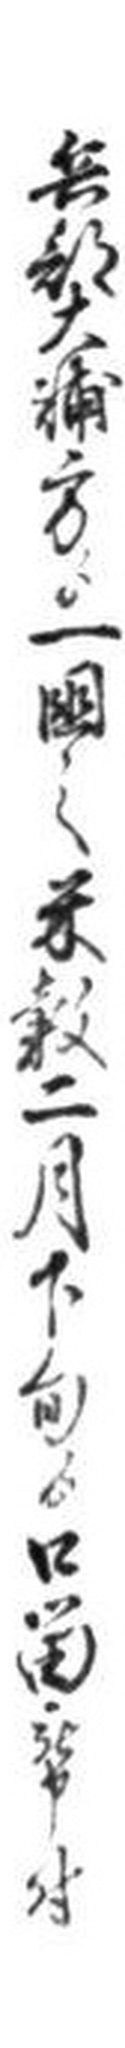兵部大輔方ゟ三国之米穀二月下旬ゟ口留被申付
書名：家譜 二十二 吉品公 従元禄十五年到同十六年
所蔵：福井県文書館 Fukui Prefectural Archives
